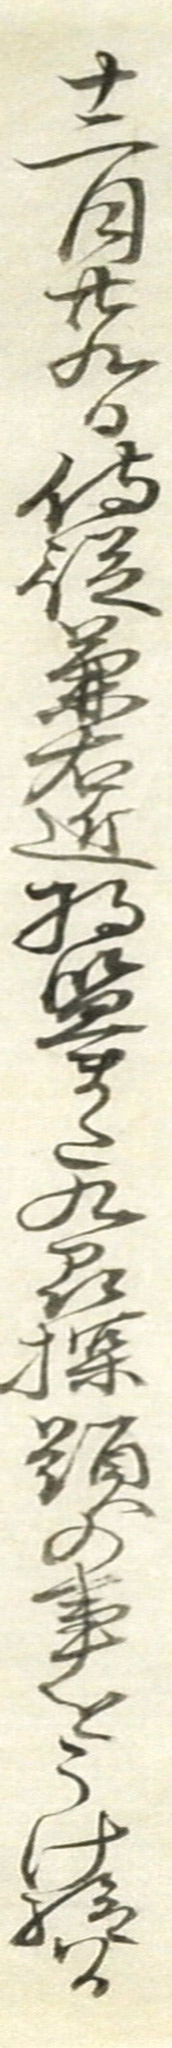十二月廿九日侍従兼右近将監また九州探題の事をうけ給はる
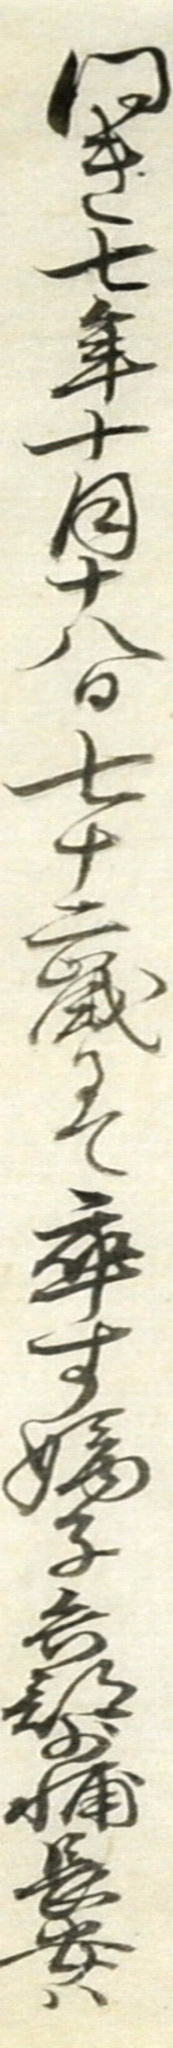同き七年十月十八日七十二歳にて卒す嫡子兵部少輔長安は
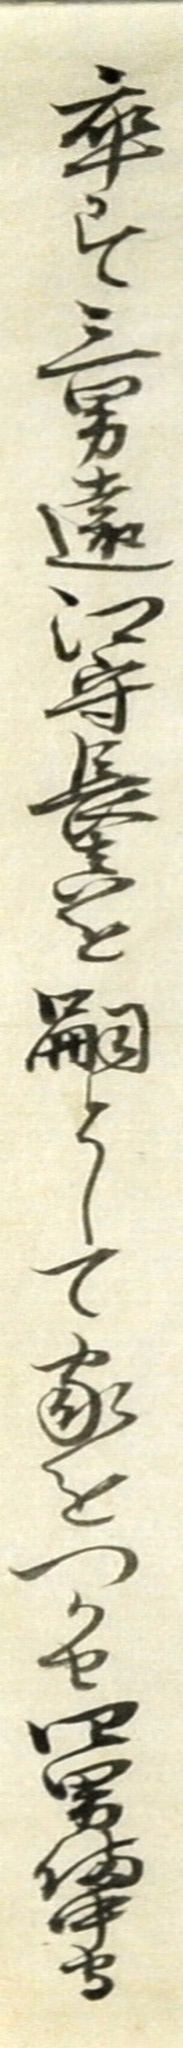卒す三男遠江守長真を嗣として家をつかせ四男備中守

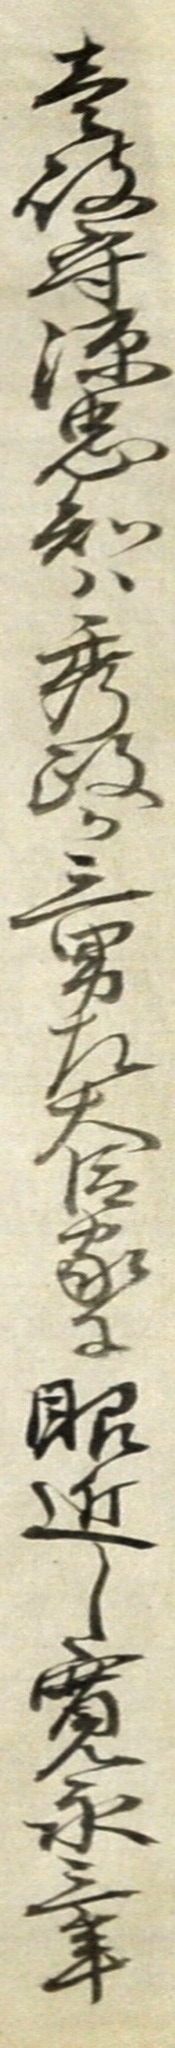壱岐守源忠知は秀政か三男左大臣家に眼近し寛永三年
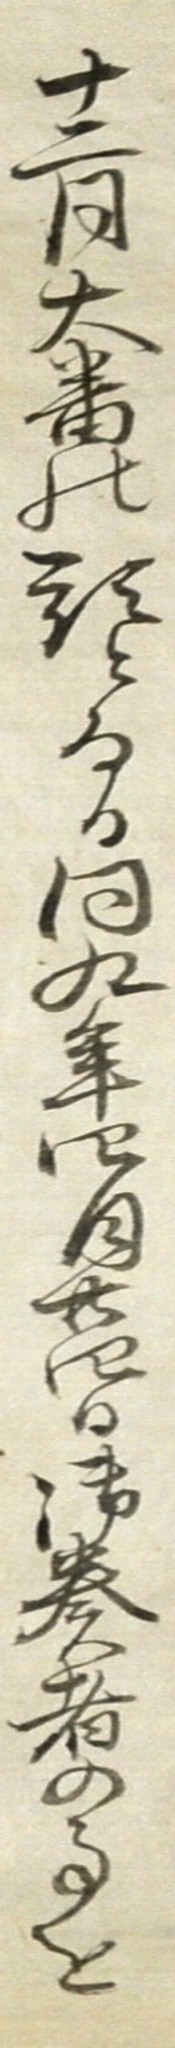十二月大番の頭となる同九年四月廿四日御奏者の事を
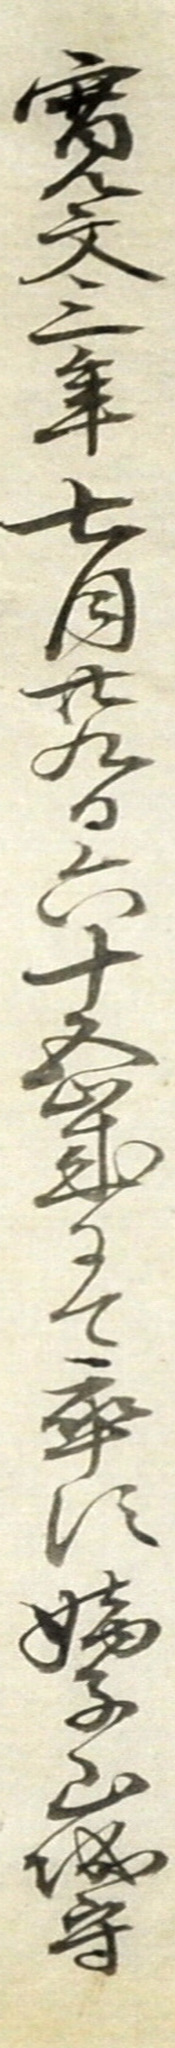寛文三年七月廿九日六十五歳にて卒す嫡子山城守
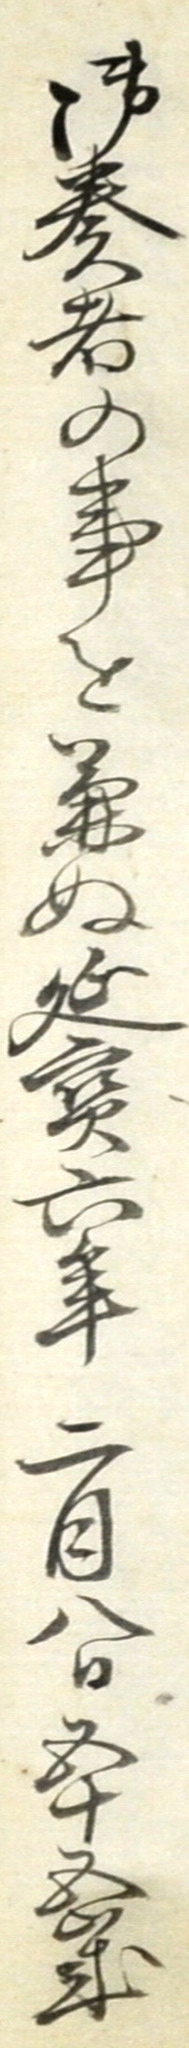御奏者の事を兼ぬ延宝六年二月八日五十五歳
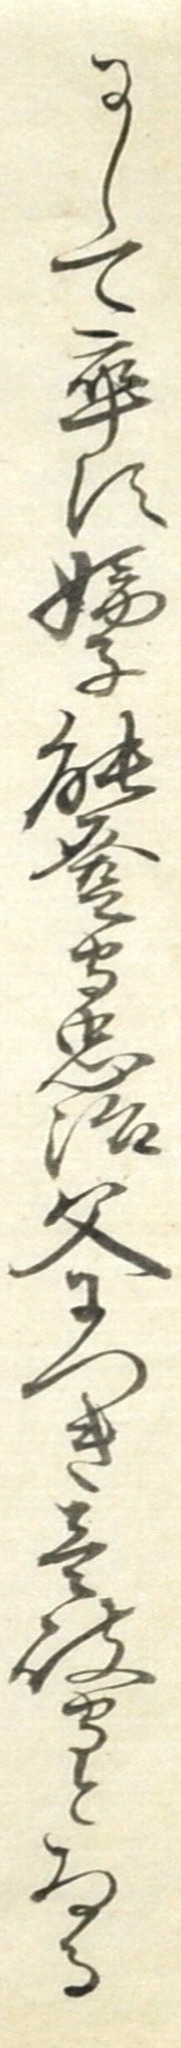にして卒す嫡子能登守忠治父につき壱岐守となる
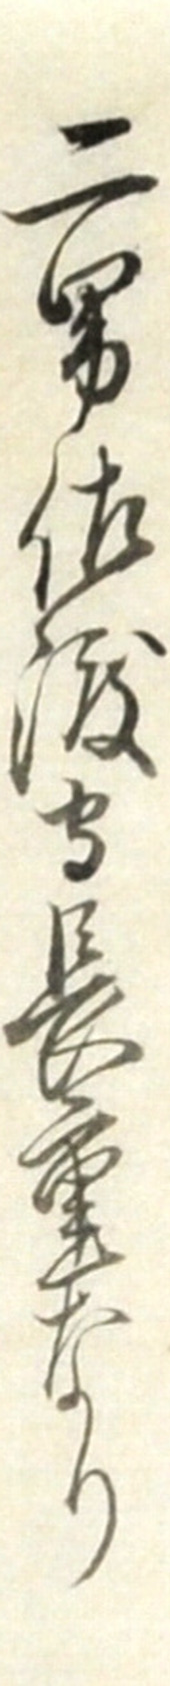二男佐渡守長重なり

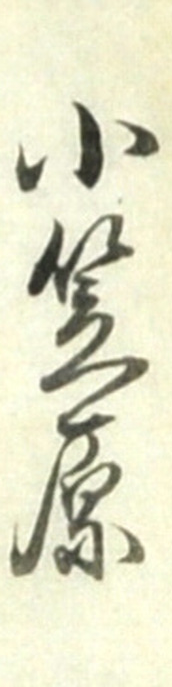小笠原
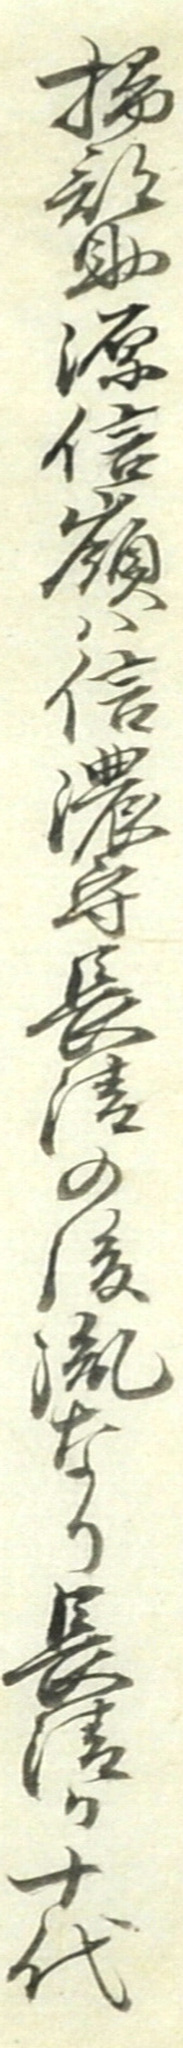掃部助源信嶺は信濃守長清の後胤なり長清か十代
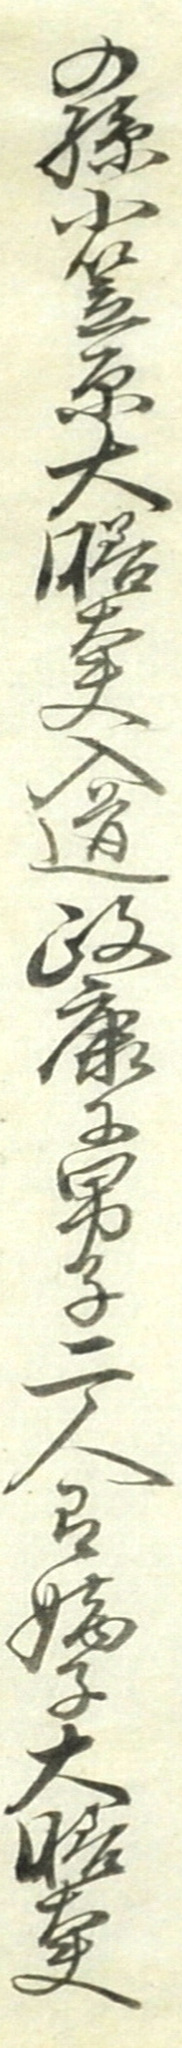の孫小笠原大膳大夫入道政康に男子二人有嫡子大膳大夫
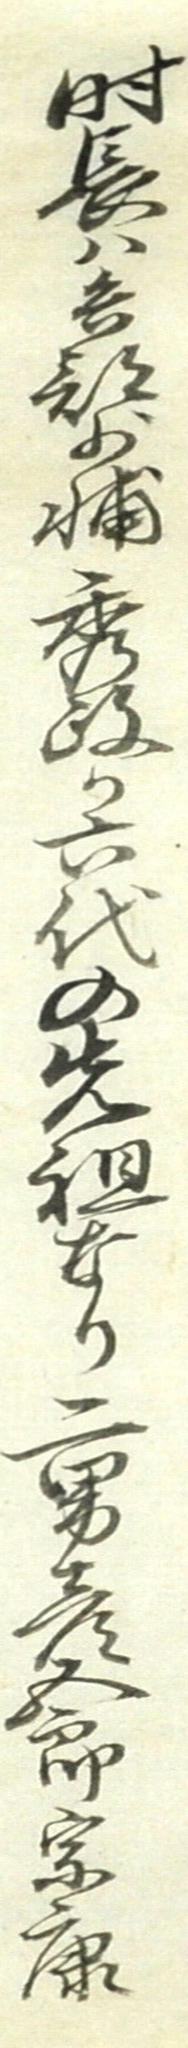時長は兵部少輔秀政か六代の先祖なり二男彦五郎宗康
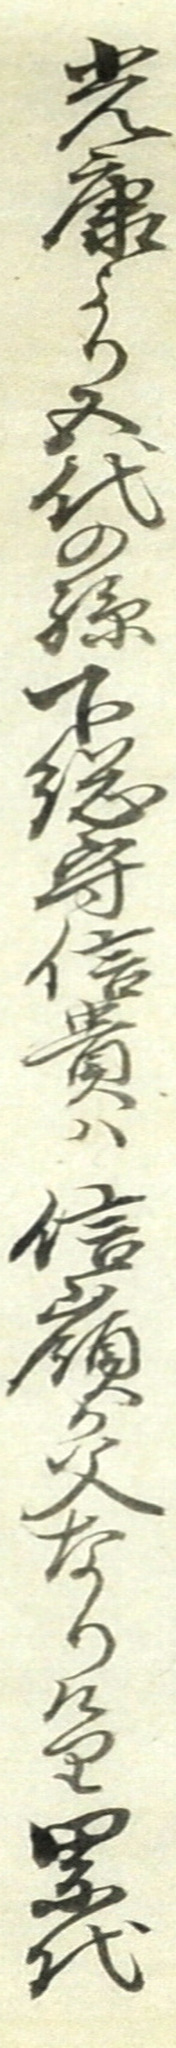光康より五代の孫下総守信貴は信嶺か父なりけり累代
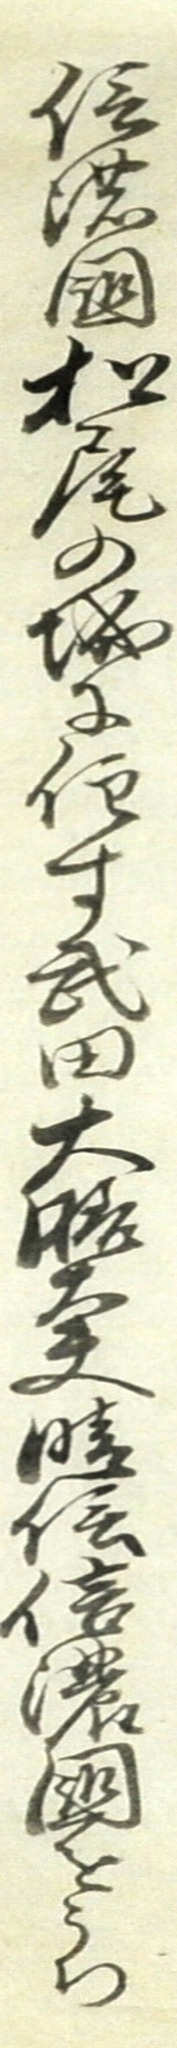信濃国松尾の城に住す武田大膳大夫晴信信濃国をうち
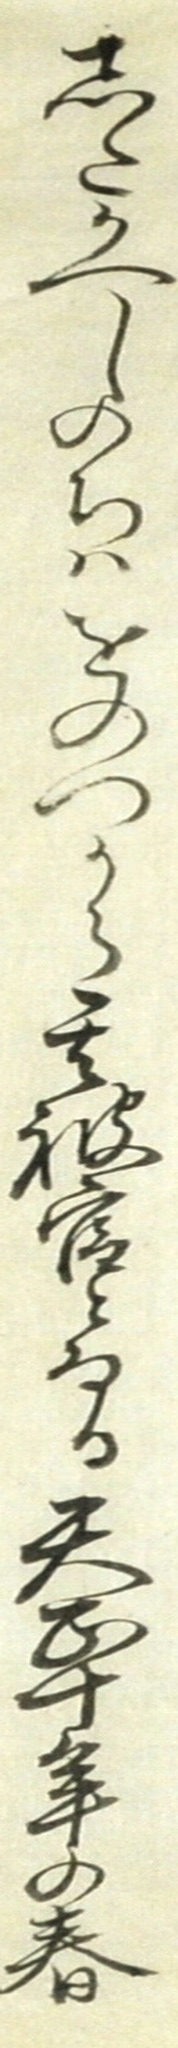したかへしのちはをのつから其被官となる天正十年の春
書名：藩翰譜（六）
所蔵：伊那市立高遠町図書館・合同会社AMANE
